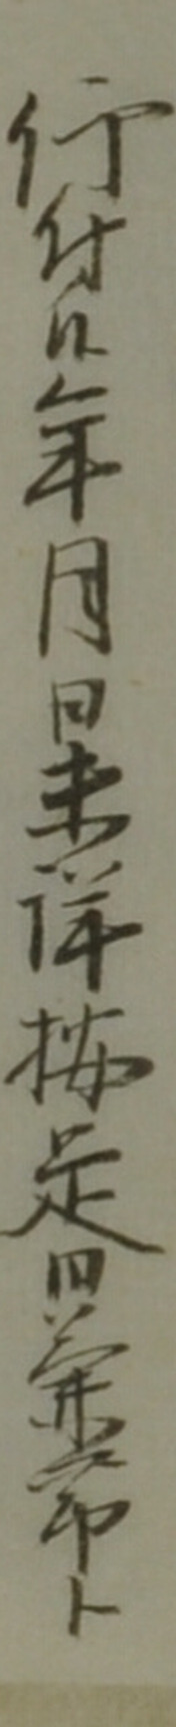仰付候年月日未詳按是日兼帯ト
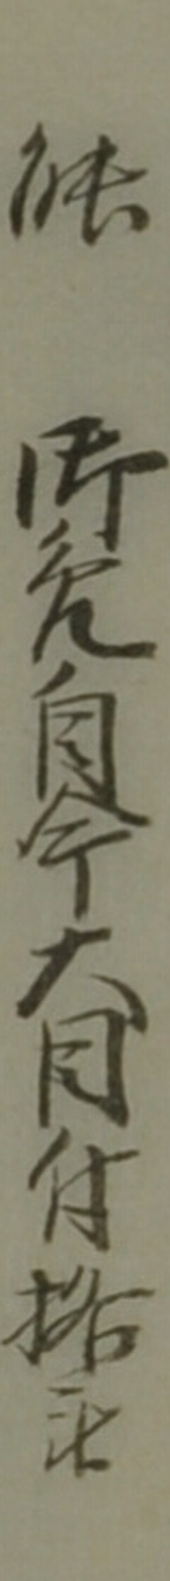能御免自今大目付格被
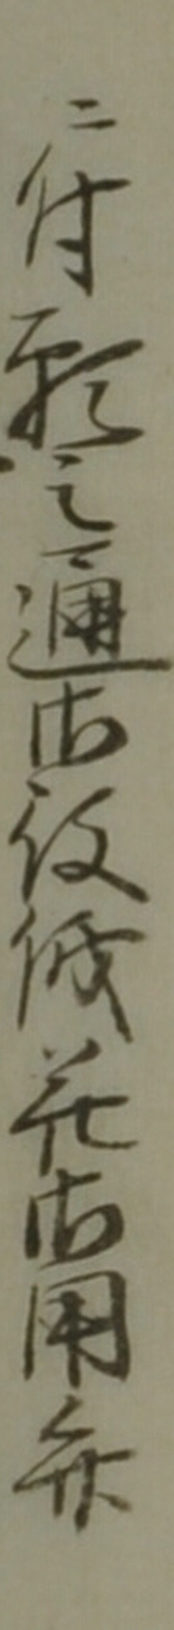ニ付願之通御役儀并御用弁
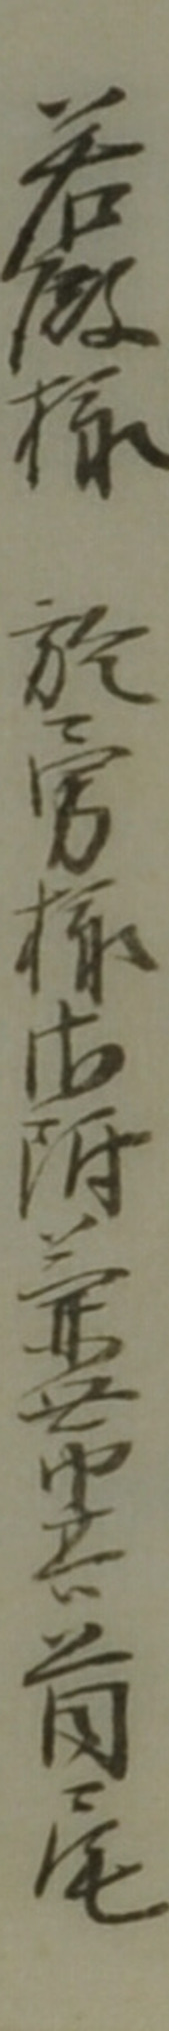若殿様於勇様御附兼帯共首尾
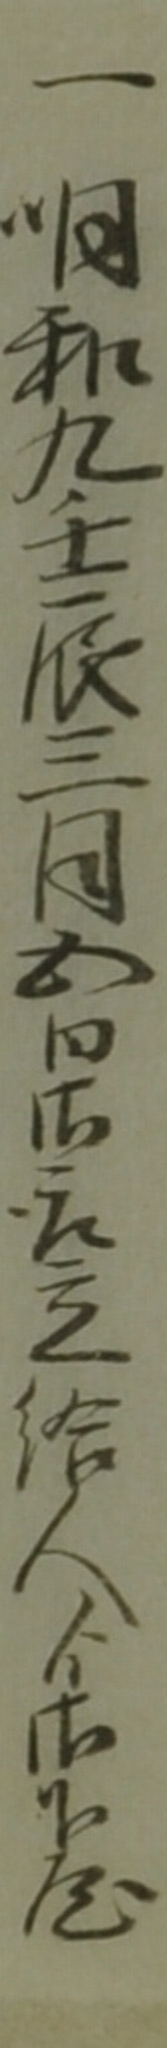一明和九壬辰三月五日御取立給人ゟ御下屋
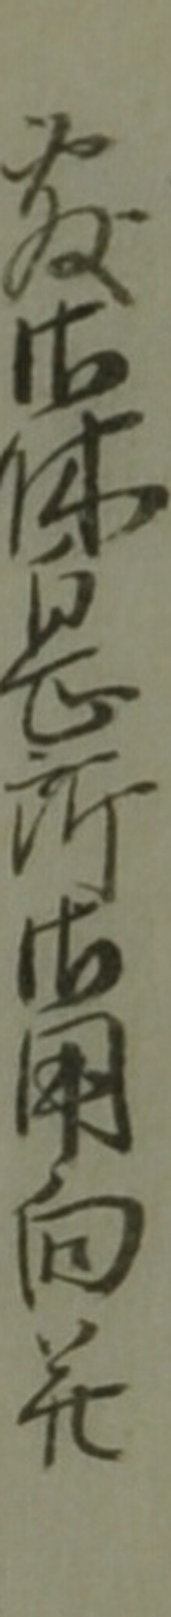敷御休息所御用向并
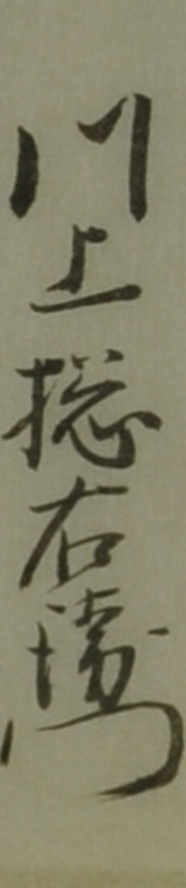川上捴右衛門
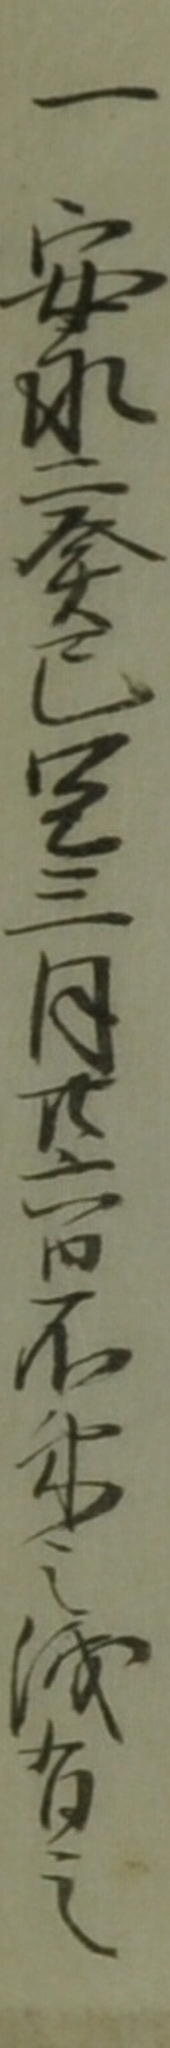一安永二癸巳閏三月廿六日不◻︎之儀有之
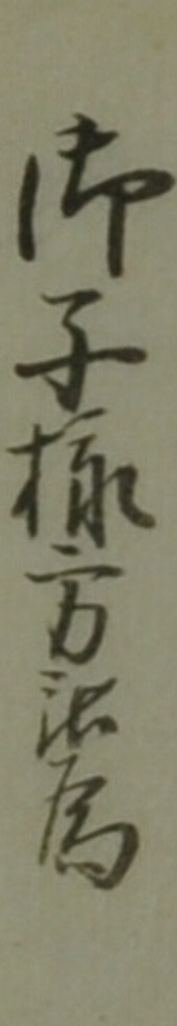御子様方御附
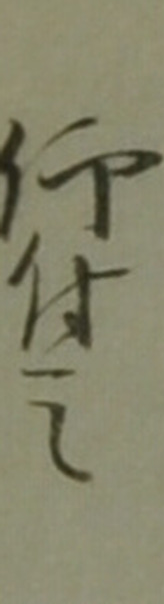仰付之
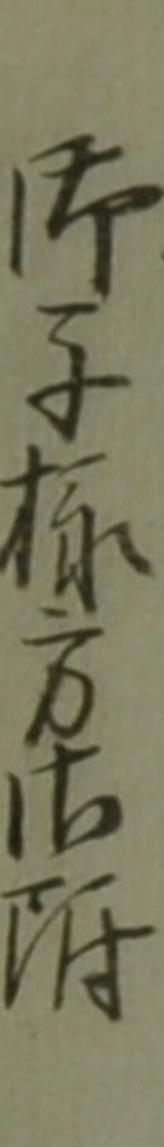御子様方御附
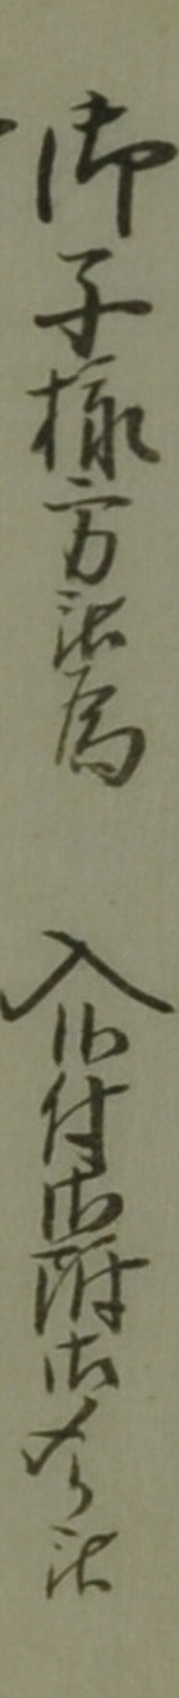御子様方被為入候付御附御〆り被
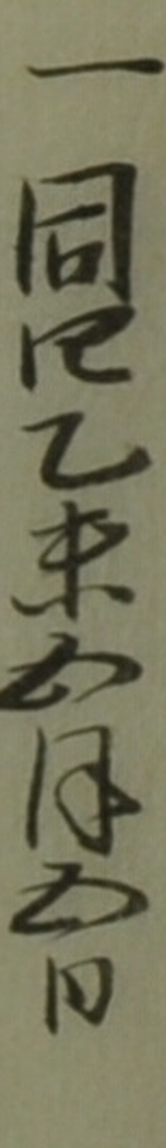一同四乙未五月五日
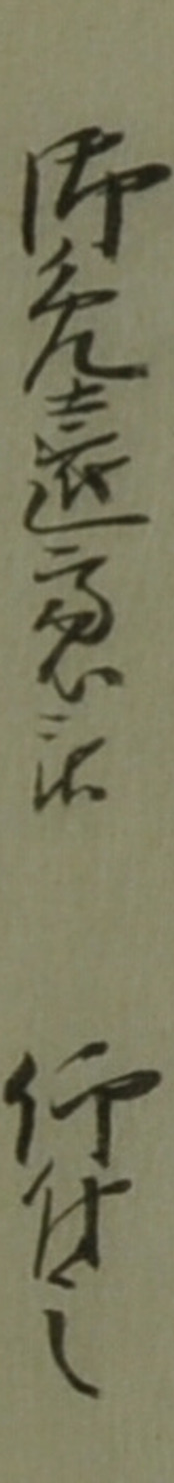御免遠慮被仰付之
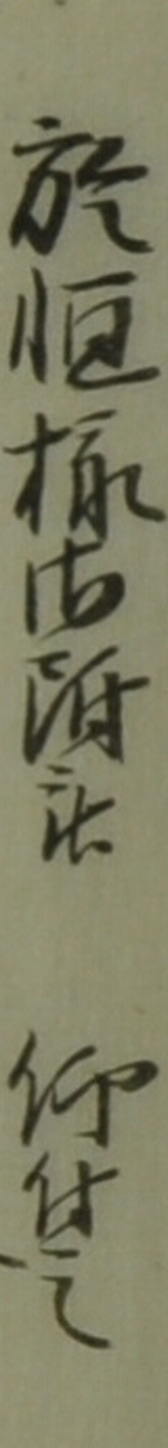於恒様御附被仰付之
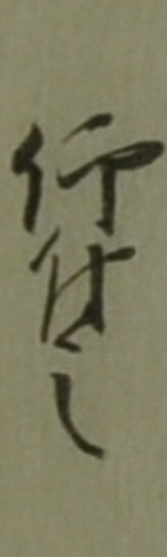仰付之
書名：諸御役代々録（六）
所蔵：伊那市立高遠町図書館・合同会社AMANE
